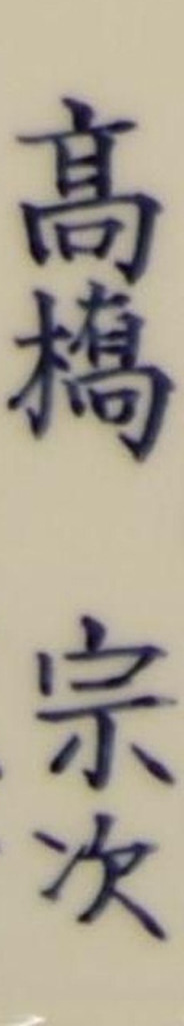高橋宗次
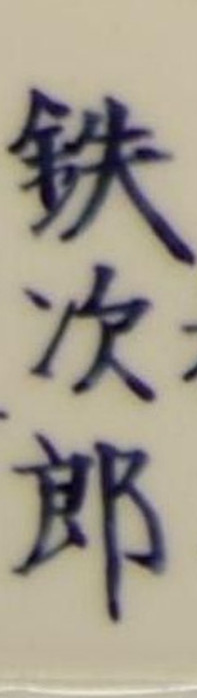鉄次郎

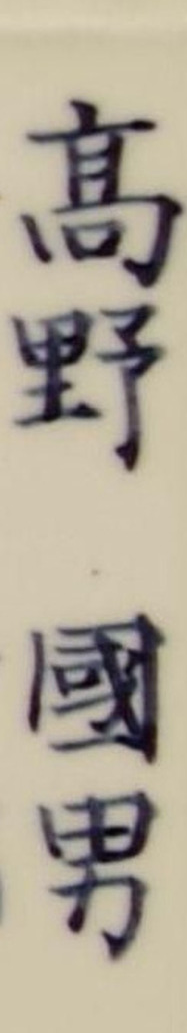高野国男
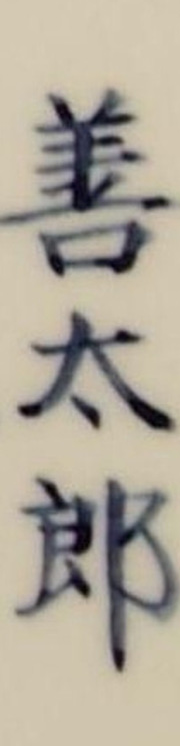善太郎
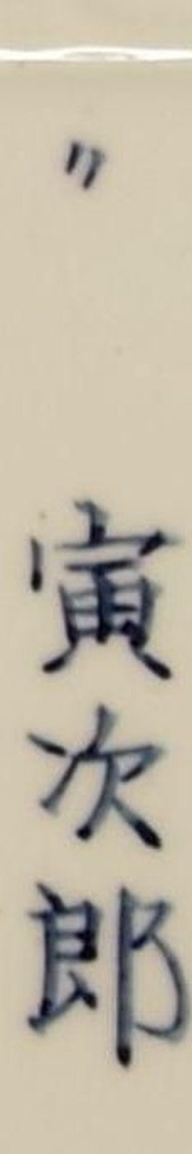寅次郎
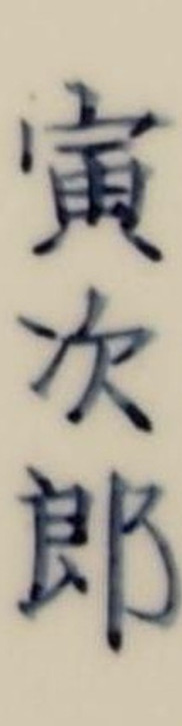寅次郎
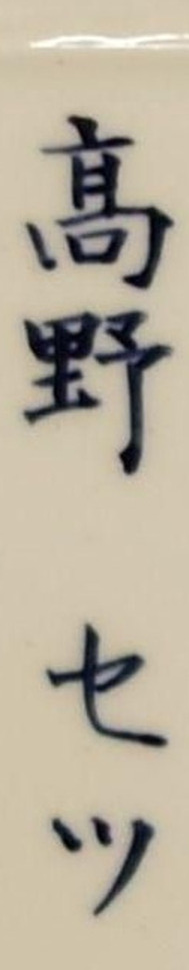高野セツ
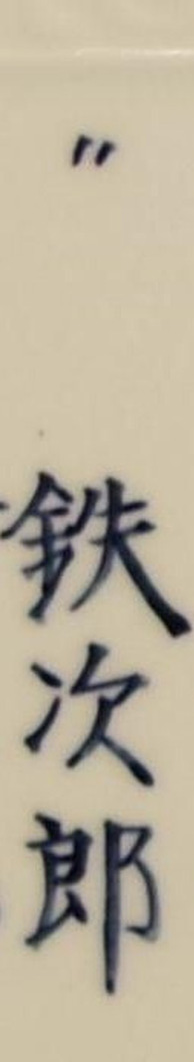鉄次郎
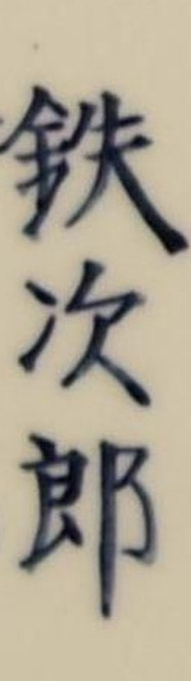鉄次郎
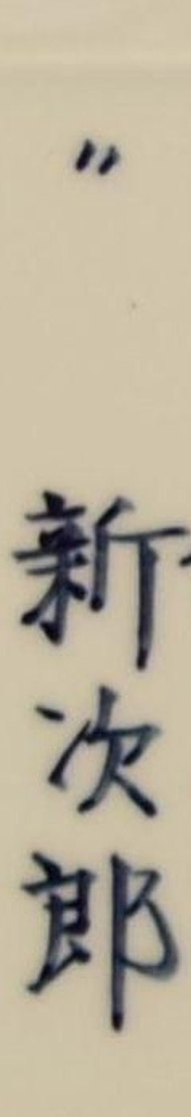新次郎
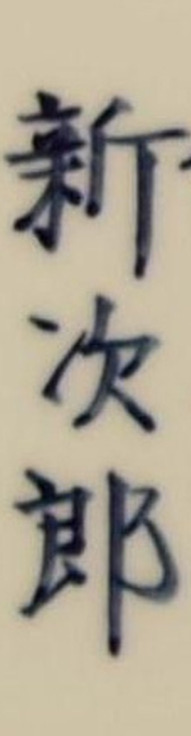新次郎
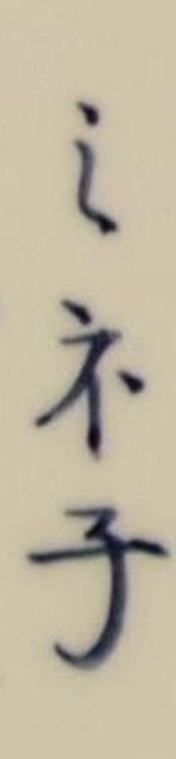ミネ子
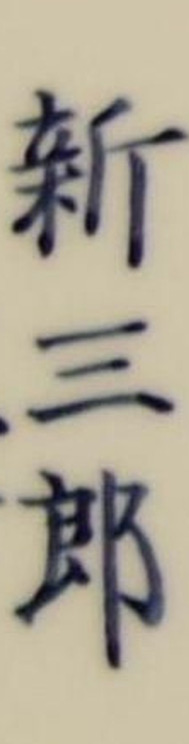新三郎
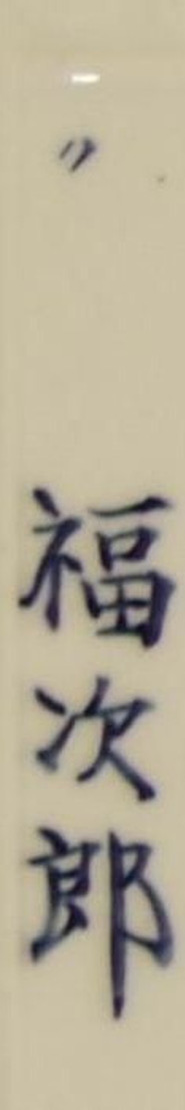福次郎
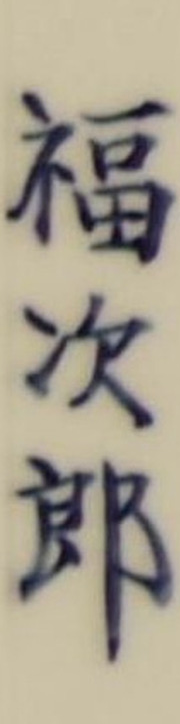福次郎

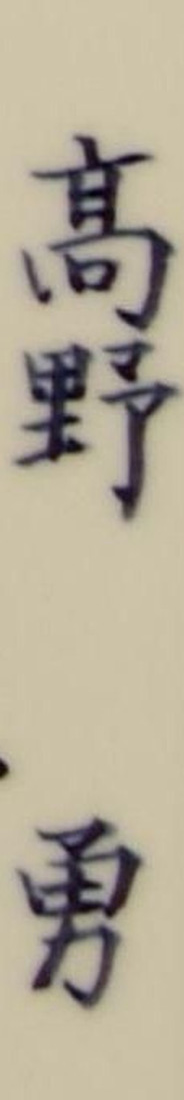高野勇
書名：A~D
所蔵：koyasan kongobuji
